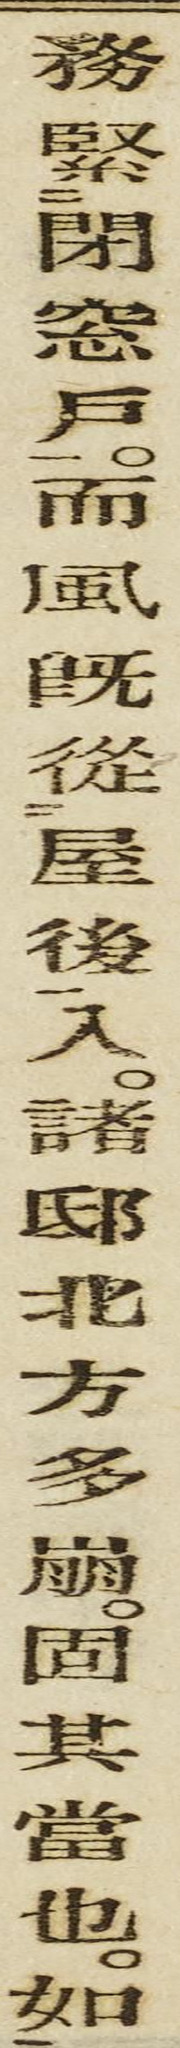務緊ニ閉窓戸。而風既従ニ屋後入。諸邸北方多崩。固其当也。如ニ
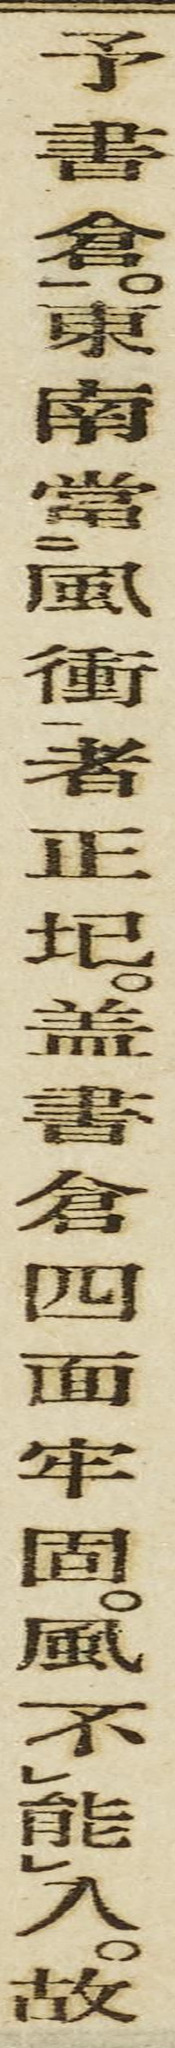予書倉。東南当ニ風衝者正圯。盖書倉四面牢固。風不能入。故
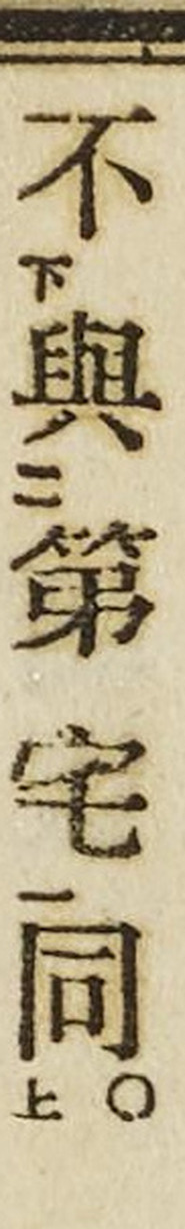不与ニ第宅同。
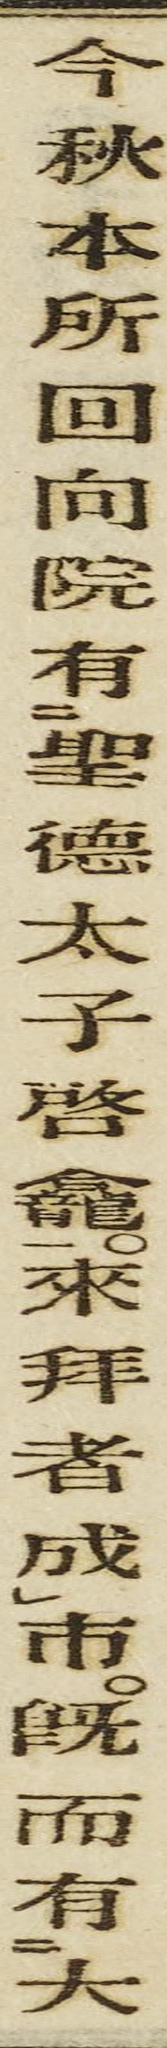今秋本所回向院有ニ聖徳太子啓龕。来拝者成市。既而有ニ大
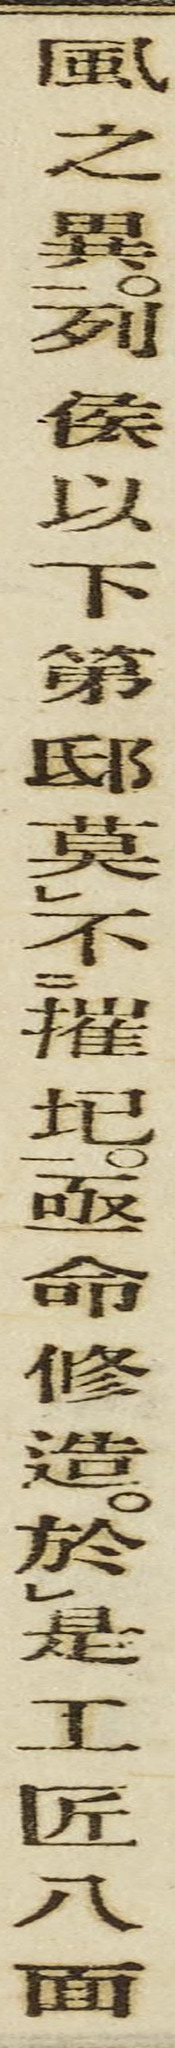風之異。列侯以下第邸莫不ニ摧圯。亟命修造。於是工匠八面
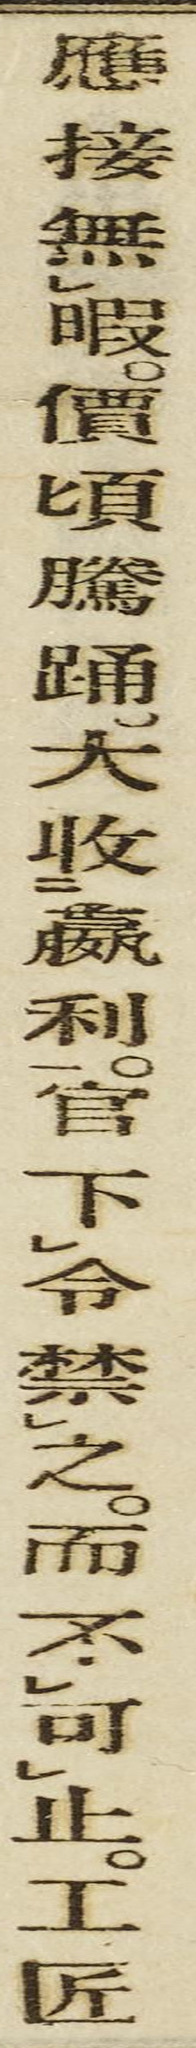応接無暇。価頃騰踊。大収ニ嬴利。官下令禁之。而不可止。工匠
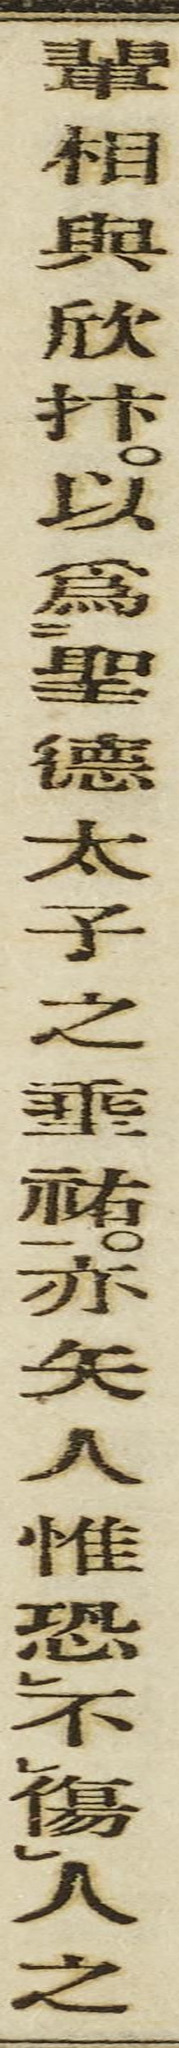輩相与欣抃。以為ニ聖徳太子之垂祐。亦矢人惟恐不傷人之
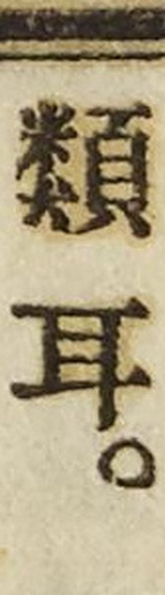類耳。

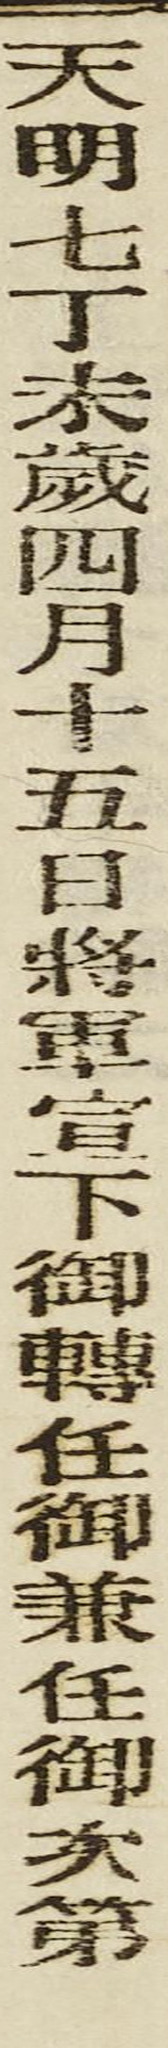天明七丁未歳四月十五日将軍宣下御転任御兼任御次第
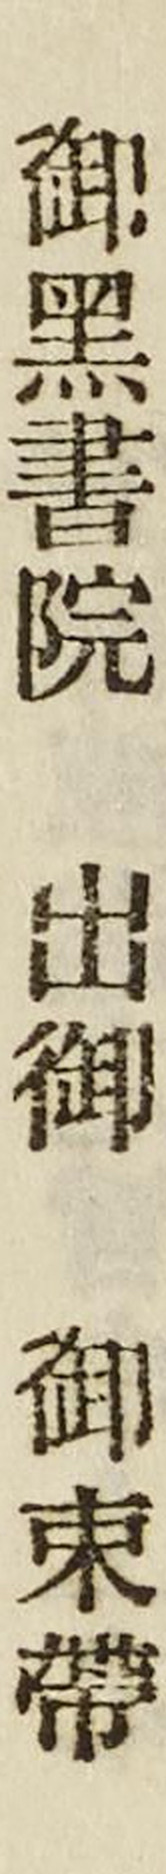御黒書院出御御束帯
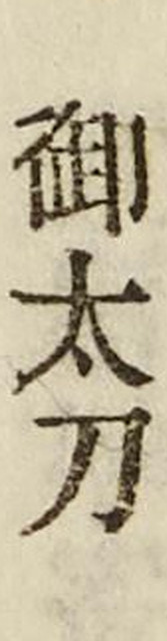御太刀
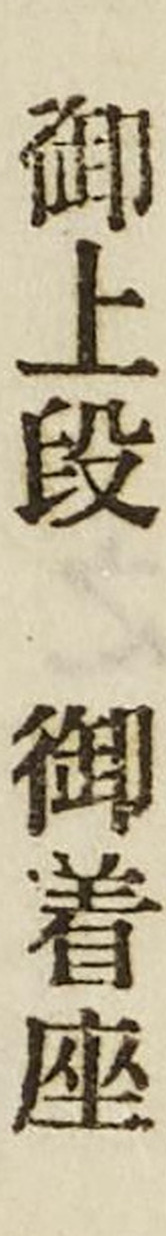御上段御着座
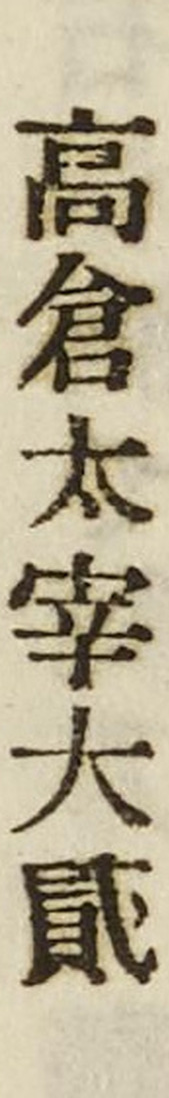高倉太宰大貳
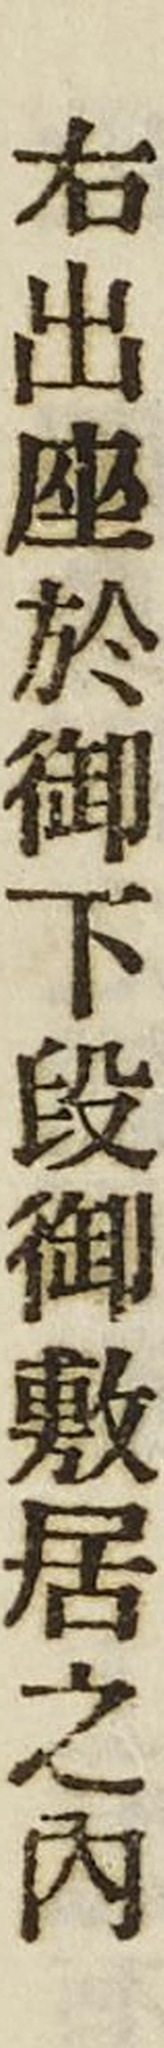右出座於御下段御敷居之内
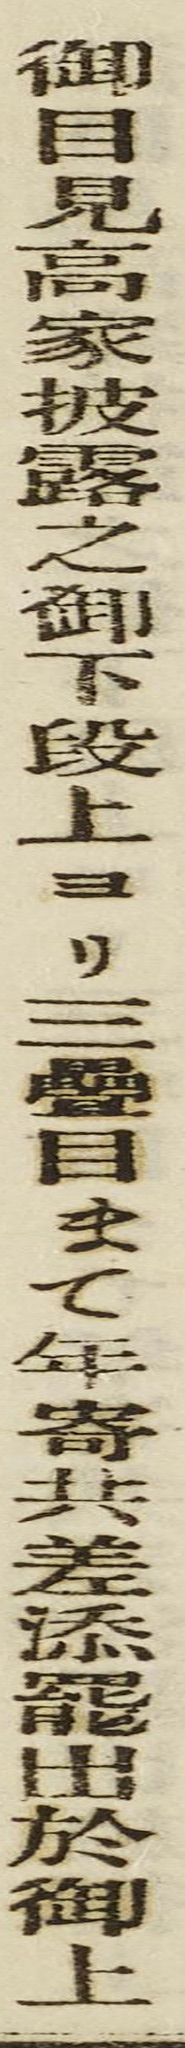御目見高家披露之御下段上ヨリ三畳目まて年寄共差添罷出於御上
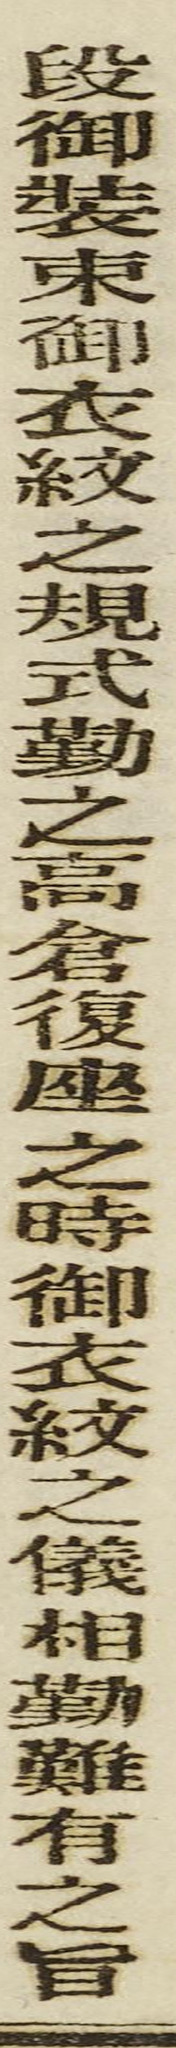段御装束御衣紋之規式勤之高倉復座之時御衣紋之儀相勤難有之旨
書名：史籍集覽　朝鮮陣古文・細井廣澤記・颶風紀事・天明七年將軍宣下次第書　全
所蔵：東京大学地震研究所図書室 Earthquake Research Institute Library, The University of Tokyo, JAPAN
